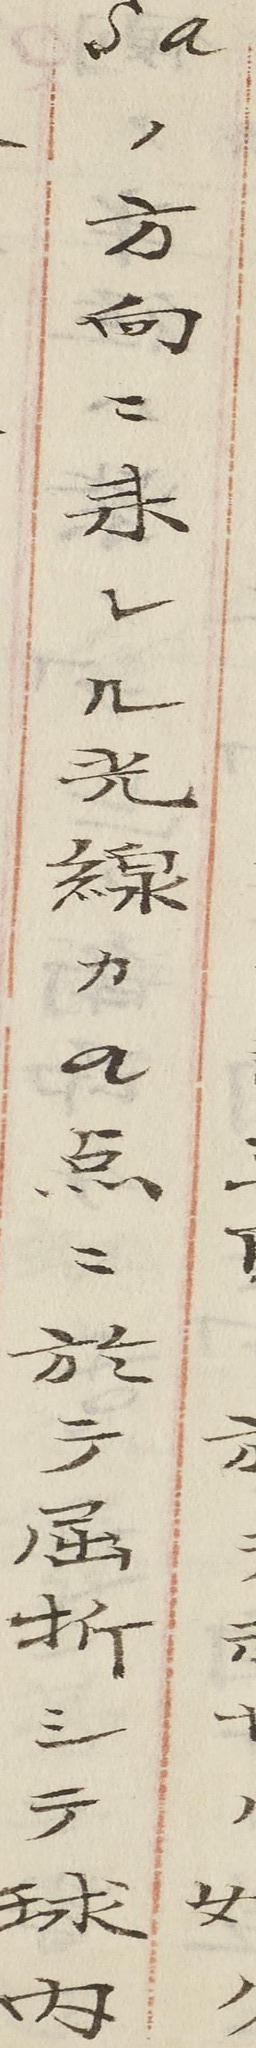Ｓａノ方向ニ来レル光線カａ点ニ於テ屈折シテ球内
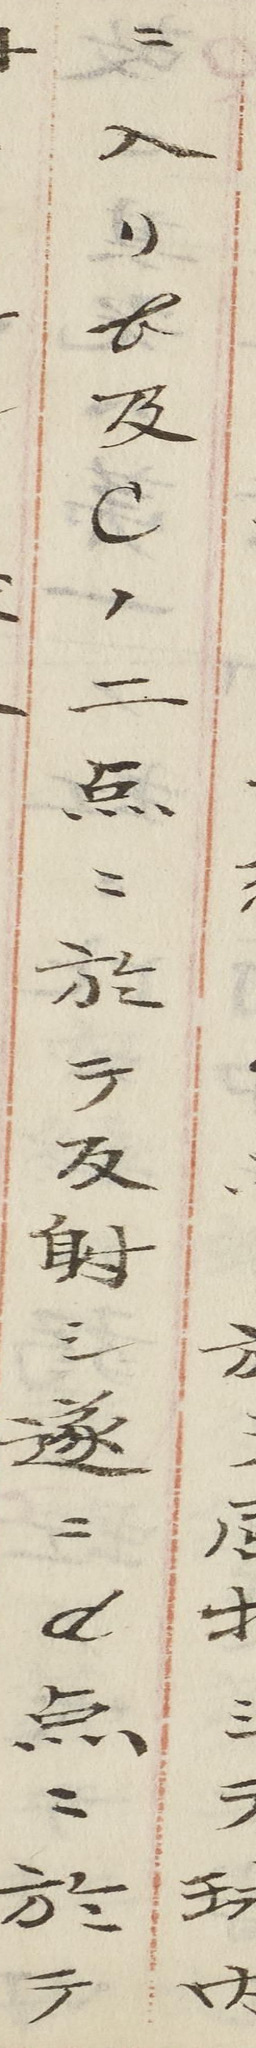ニ入リｂ及ｃノニ点ニ於テ反射シ遂ニｄ点ニ於テ
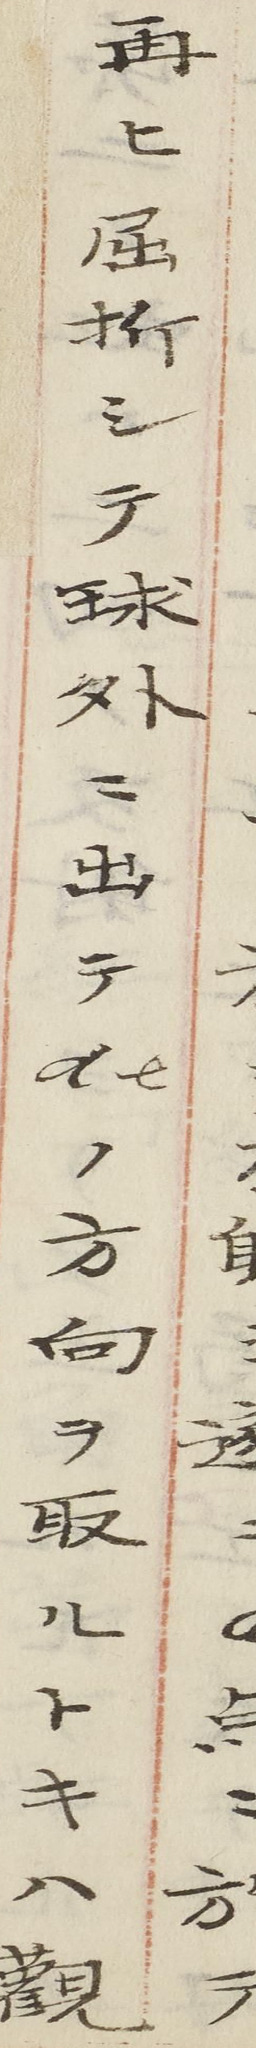再ヒ屈折シテ球外ニ出テｄｅノ方向ヲ取ルトキハ観
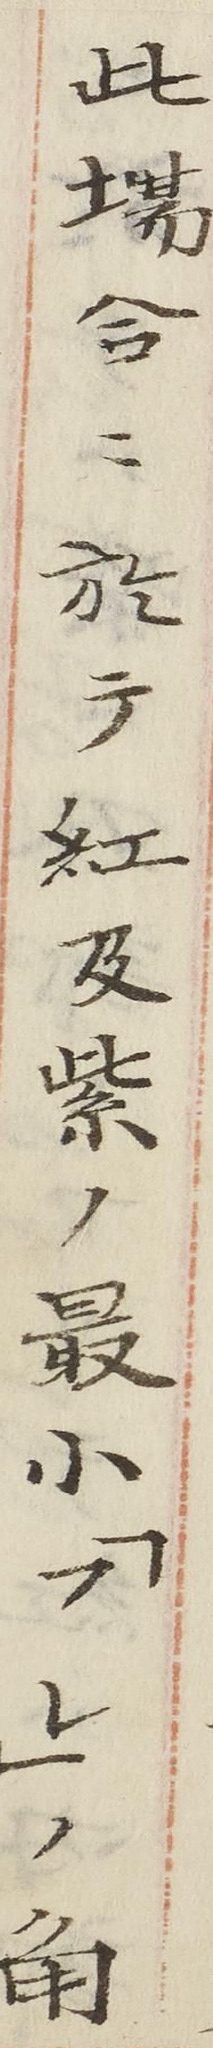此場合ニ於テ紅及紫ノ最小「フレ」ノ角
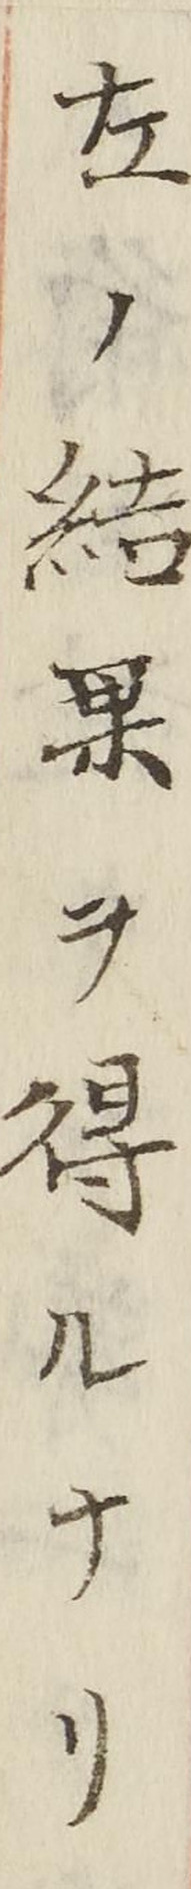左ノ結果ヲ得ルナリ

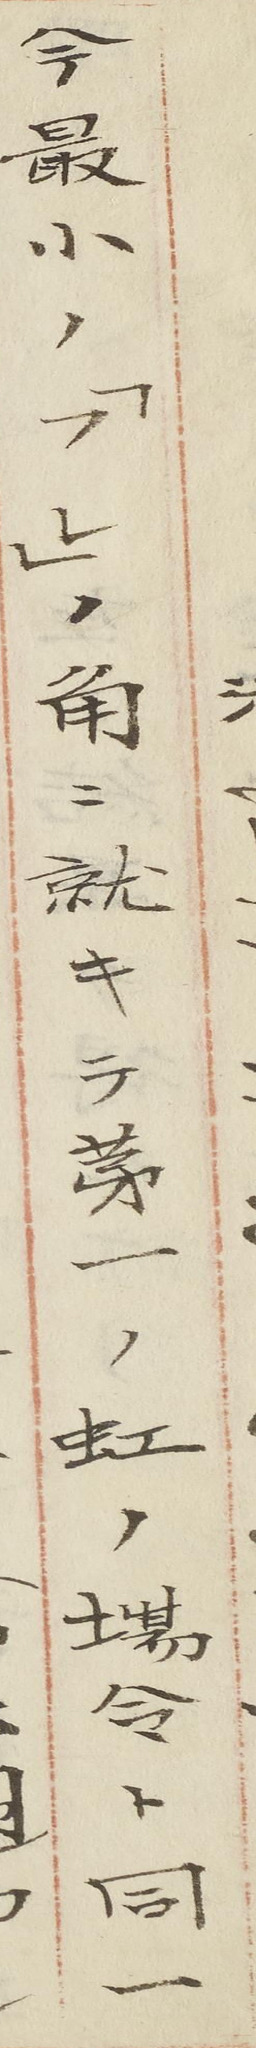今最小ノ「フレ」ノ角ニ就キテ第一ノ虹ノ場合ト同一
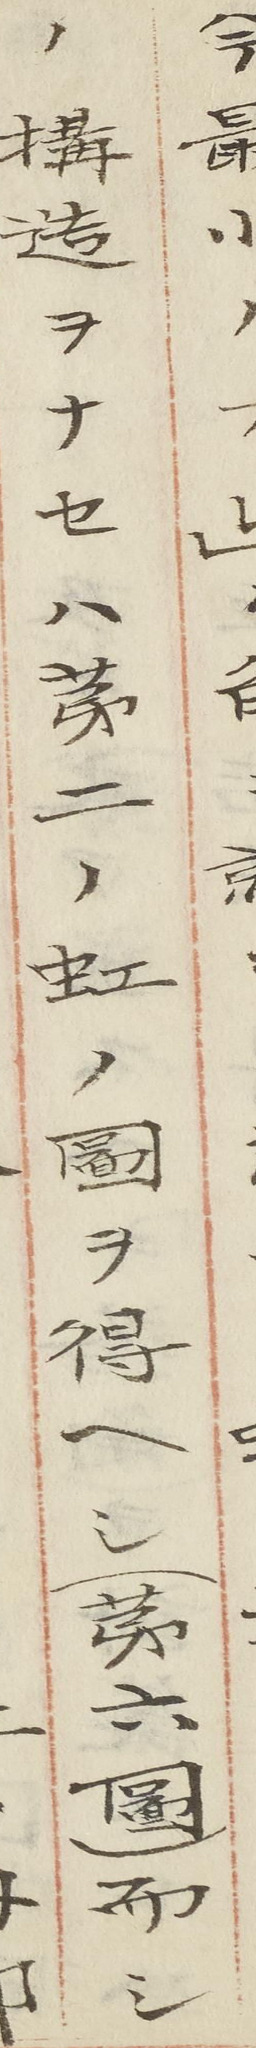ノ構造ヲナセハ第二ノ虹ノ図ヲ得ヘシ而シ
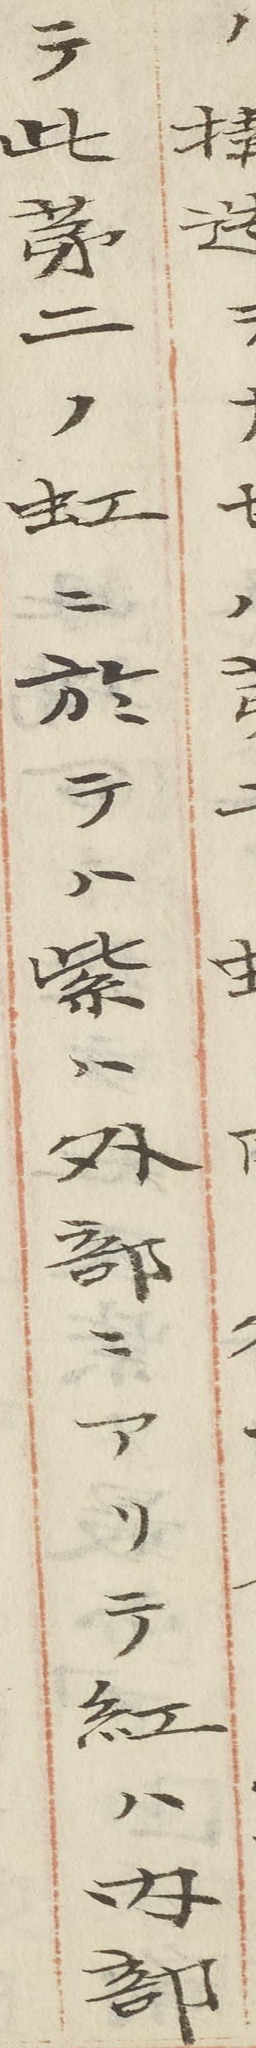テ此第二ノ虹ニ於テハ紫ハ外部ニアリテ紅ハ内部
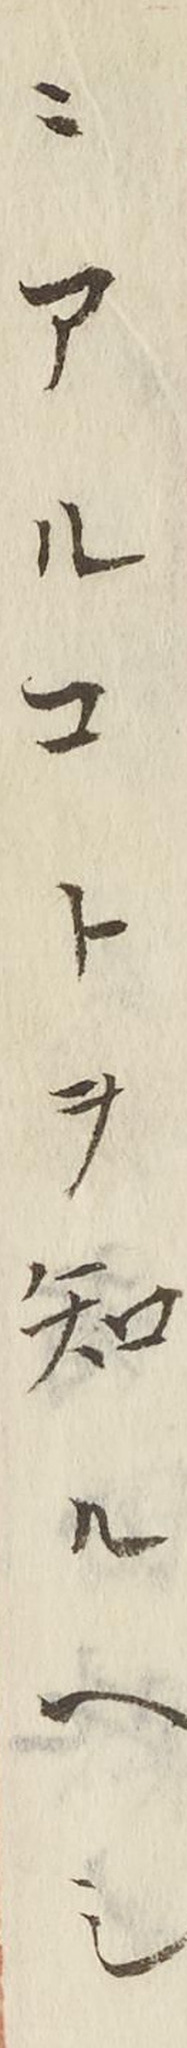ニアルコトヲ知ルヘシ
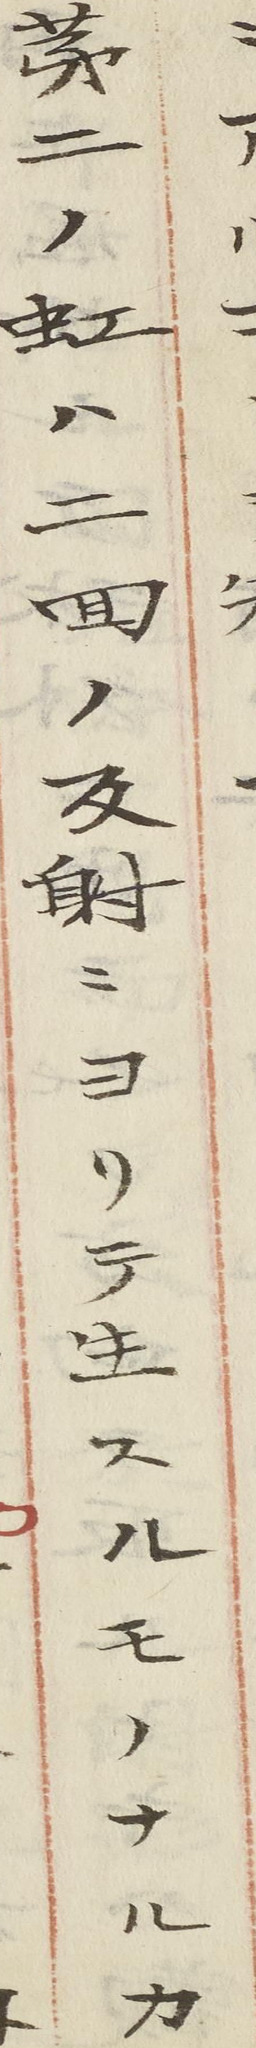第二ノ虹ハニ回ノ反射ニヨリテ生スルモノナルカ
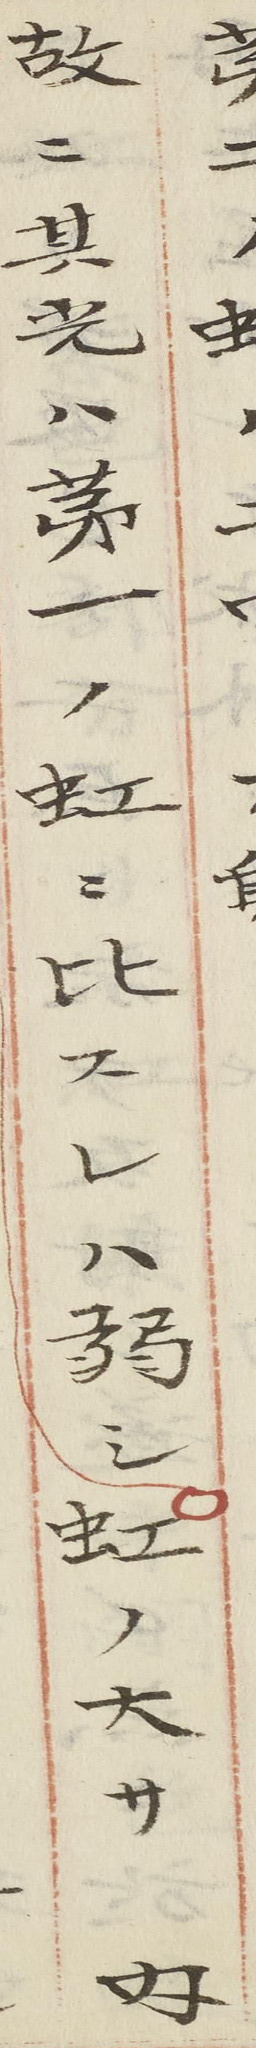故ニ其光ハ第一ノ虹ニ比スレハ弱シ○虹ノ大サ内
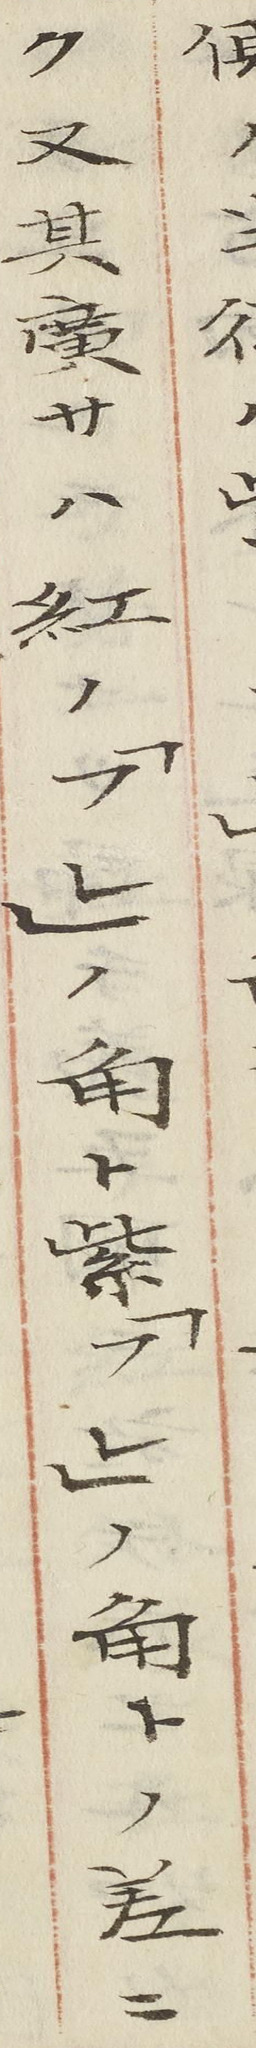ク又広サハ紅ノ「フレ」ノ角ト紫「フレ」ノ角トノ差ニ
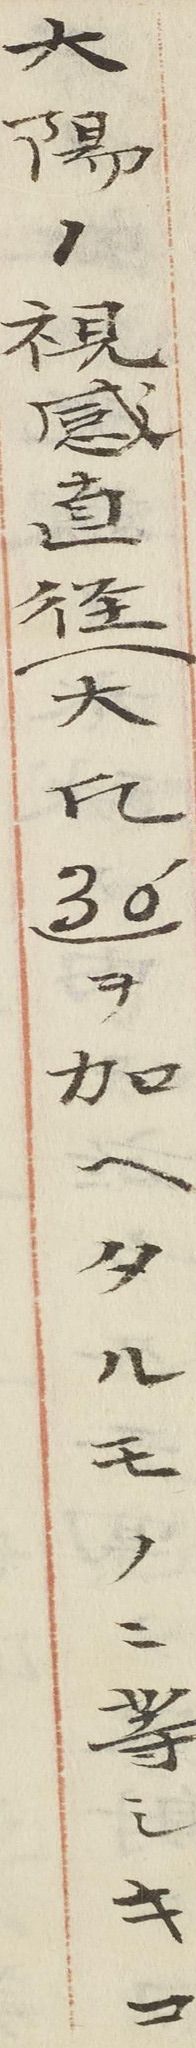大陽ノ視感直径ヲ加ヘタルモノニ等シキコ
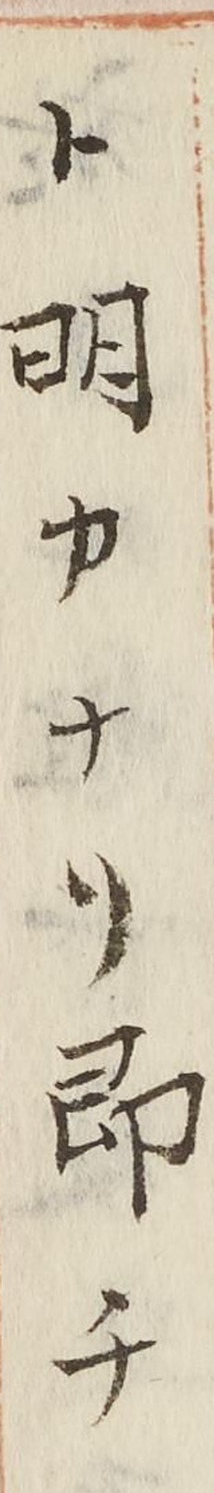ト明カナリ即チ
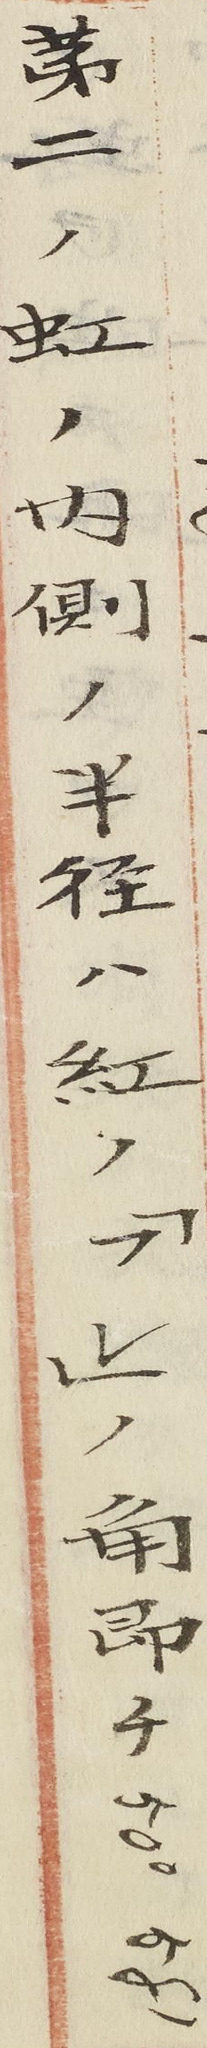第二ノ虹ノ内側ノ半径ハ紅ノ「フレ」ノ角即チ。’
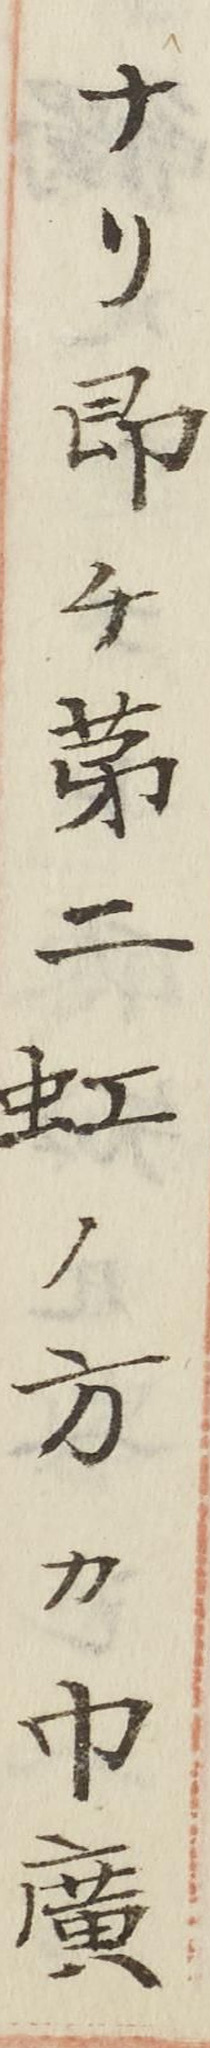六ナリ即チ第二虹ノ方カ巾広
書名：虹及ハロノ説明
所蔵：東京大学地震研究所図書室 Earthquake Research Institute Library, The University of Tokyo, JAPAN
